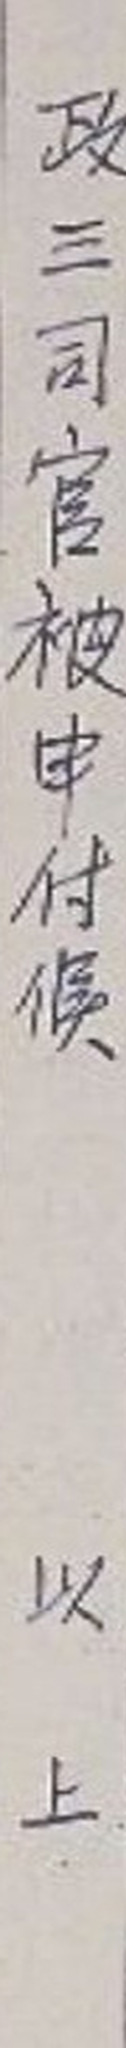政三司官被申付候以上
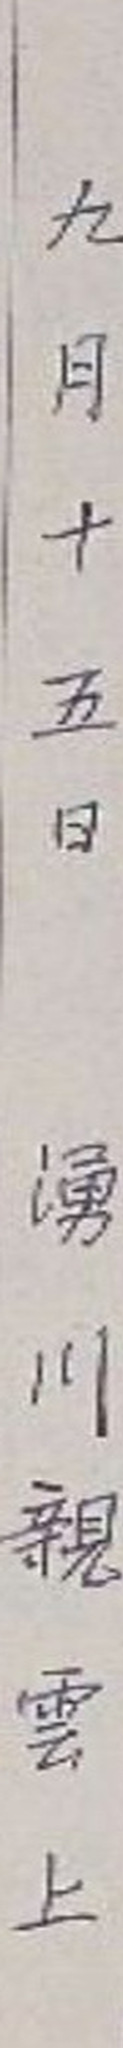九月十五日湧川親雲上
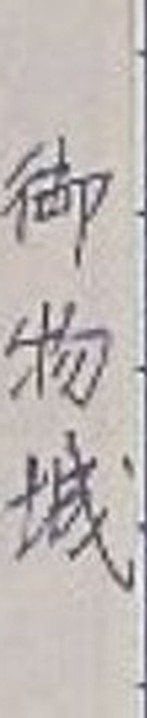御物城
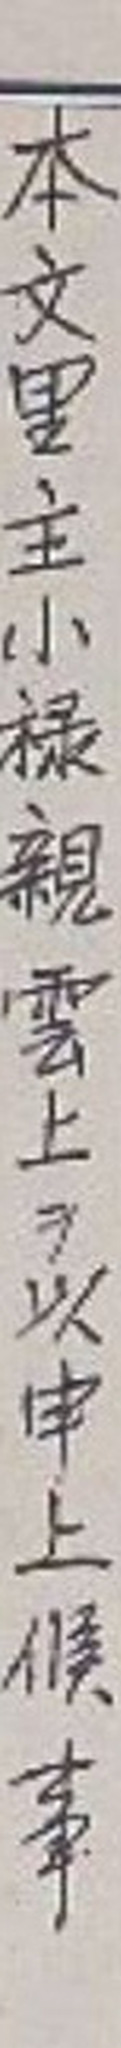本文里主小禄親雲上を以申上候事
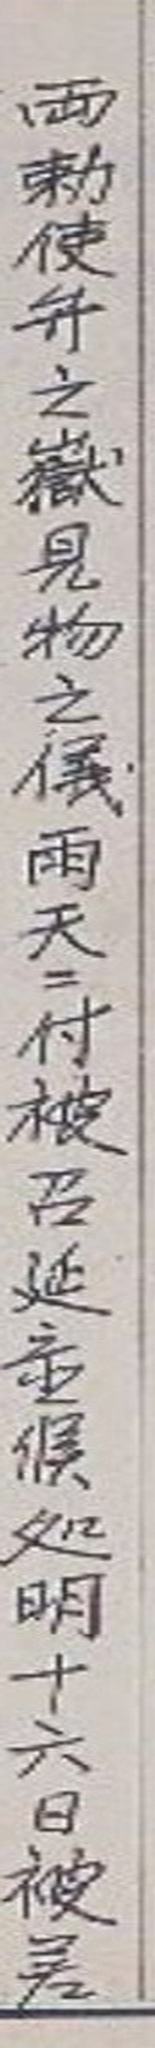両勅使弁之嶽見物之儀雨天に付被召延置候処明十六日被差
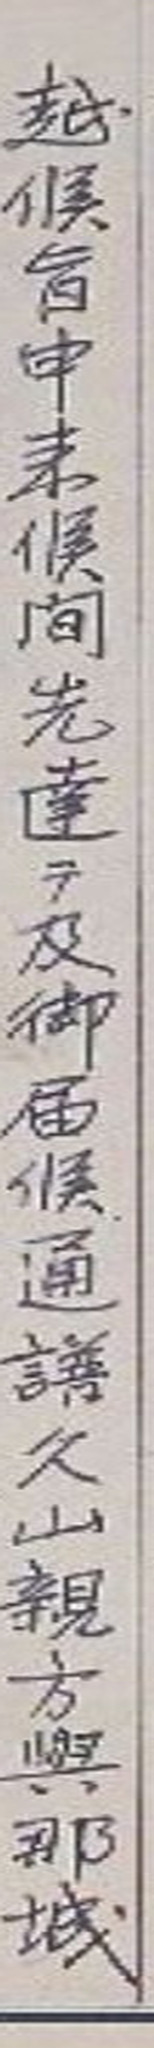越候旨申来候間先達て及御届候通譜久山親方与那城
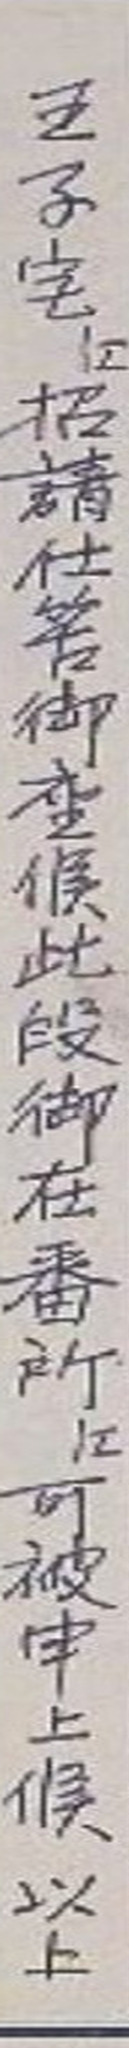王子宅え招請仕筈御座候此段御在番所え可被申上候以上
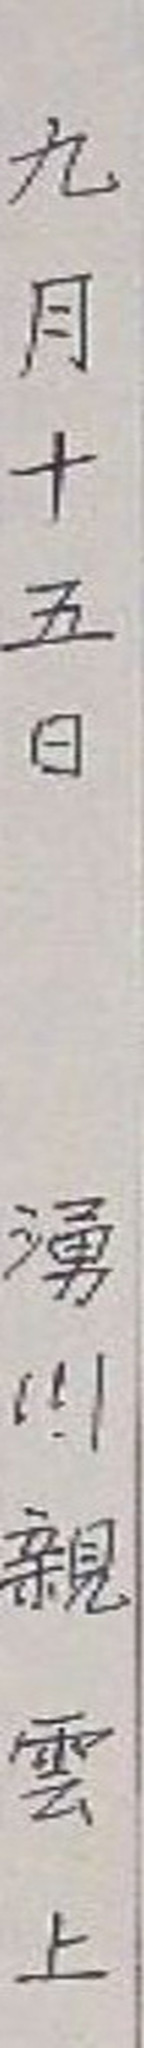九月十五日湧川親雲上
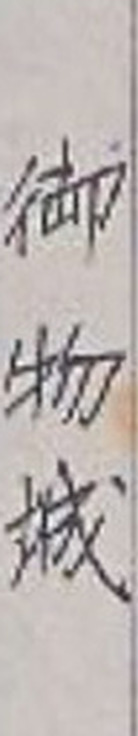御物城
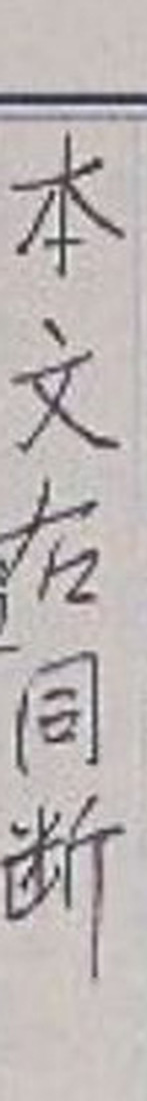本文右同断
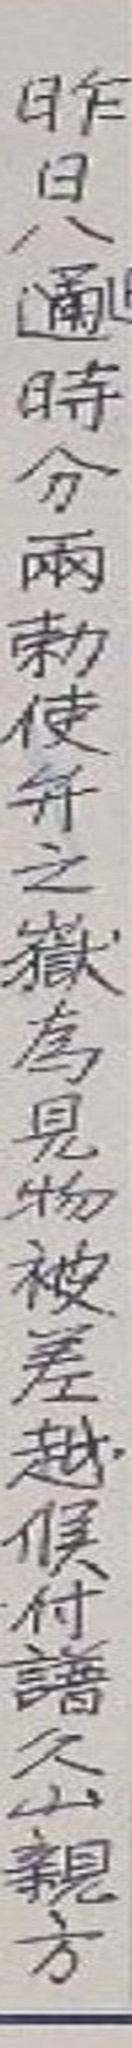昨日八過時分両勅使弁之嶽為見物被差越候付譜久山親方
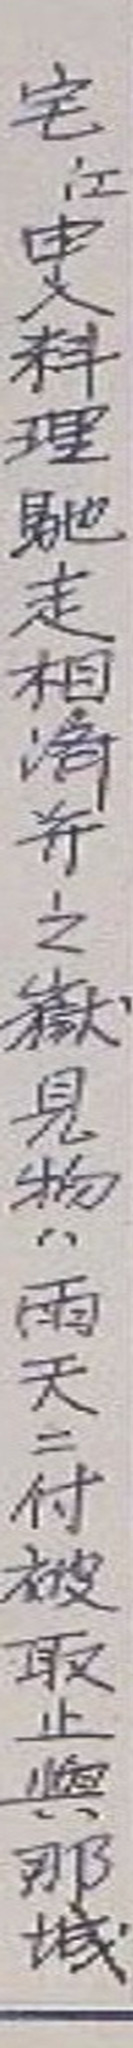宅え申入料理馳走相済弁之嶽見物は雨天に付被取止与那城
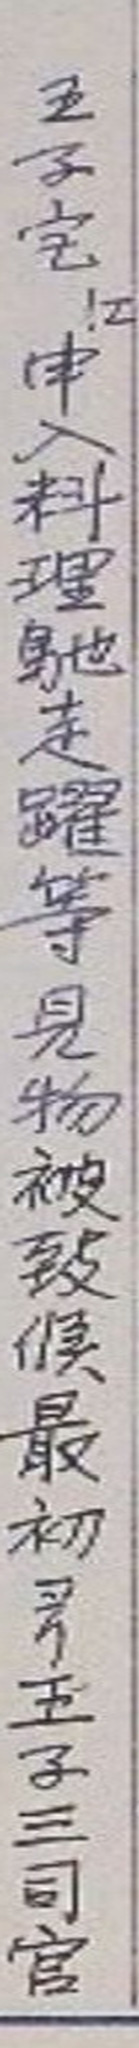王子宅え申入料理馳走躍等見物被致候最初より王子三司官
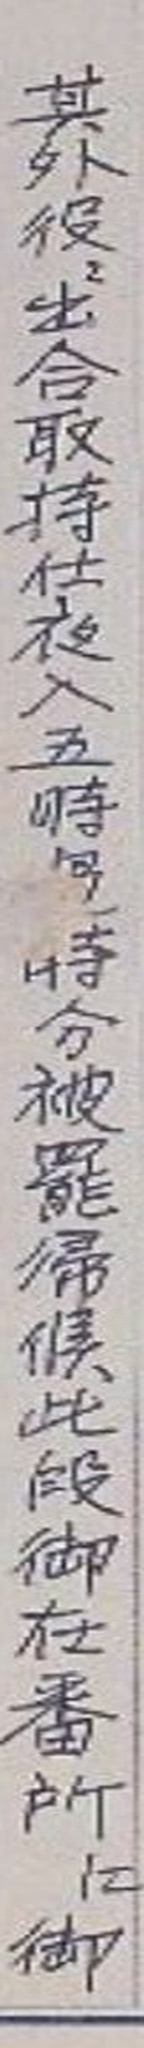其外役々出合取持仕夜入五時過時分被罷帰候此段御在番所え御

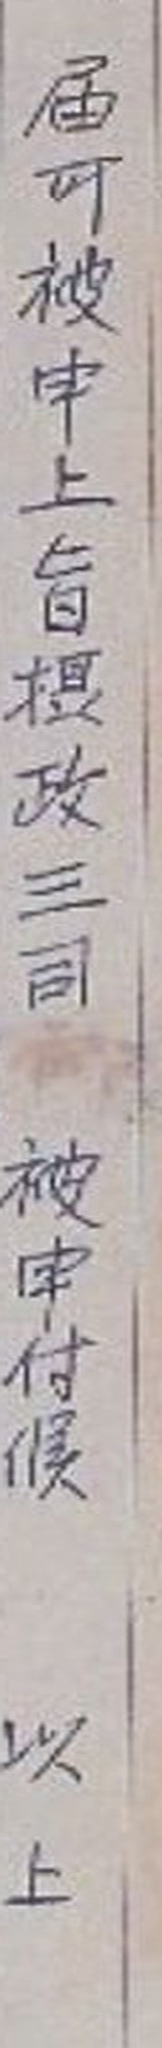届可申上旨摂政三司官被申付候以上
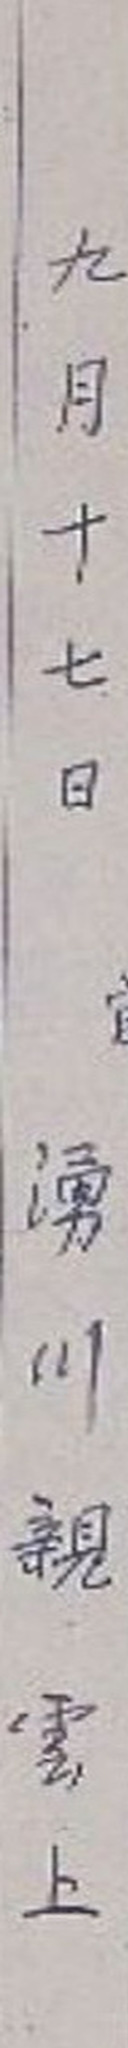九月十七日湧川親雲上
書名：支那冊封使来琉諸記 下巻
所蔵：University of the Ryukyus Library
